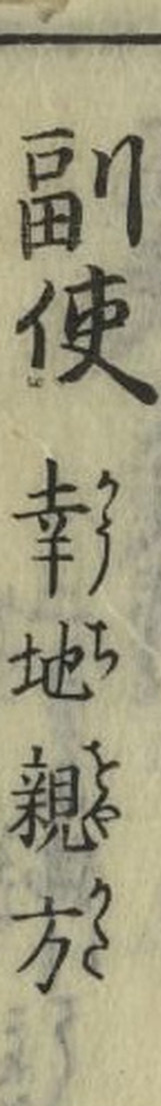副使幸地親方
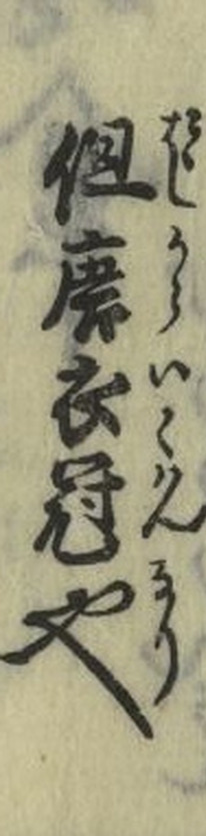但唐衣冠也
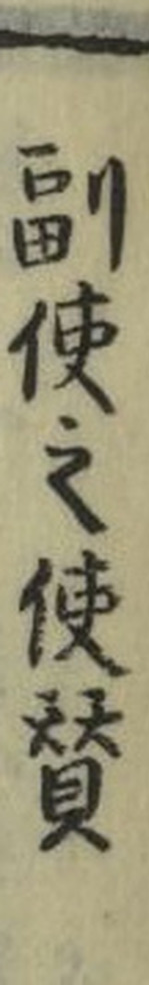副使之使賛
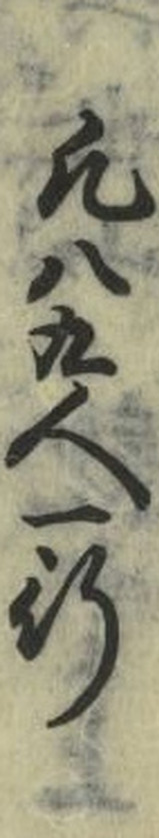凡八九人一行
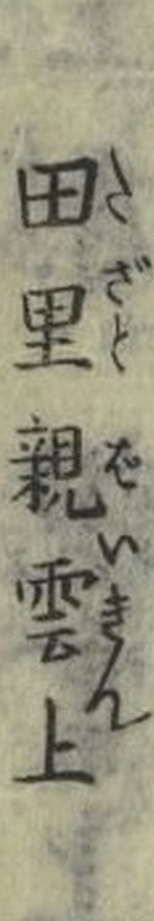田里親雲上
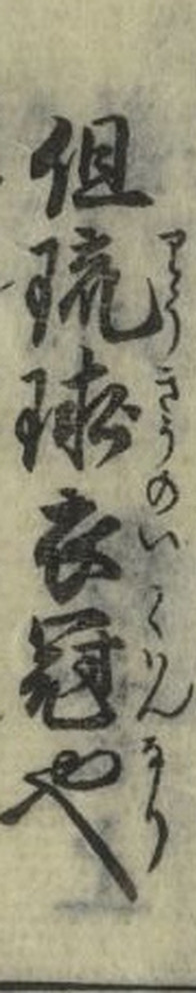但琉球衣冠也
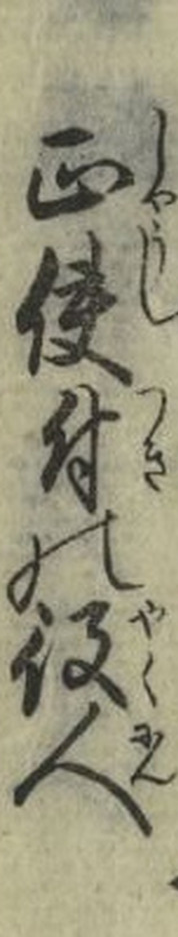正使付の役人
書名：琉球人大行列記
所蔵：University of the Ryukyus Library
